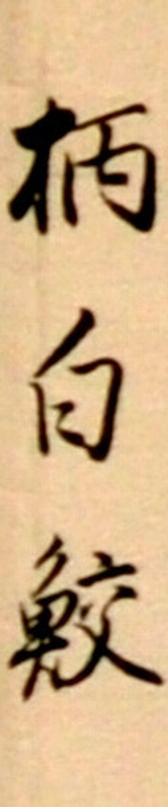柄白鮫
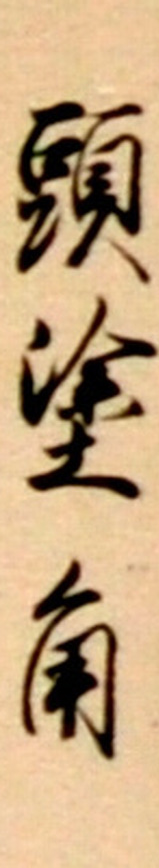頭塗角
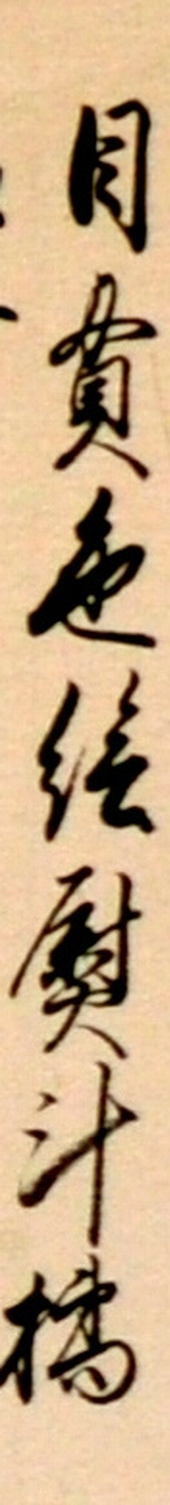目貫色絵熨斗橘
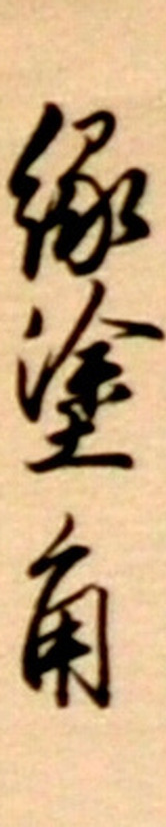縁塗角
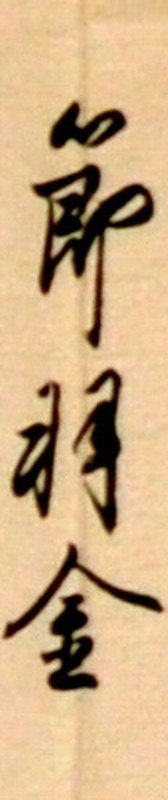節羽金
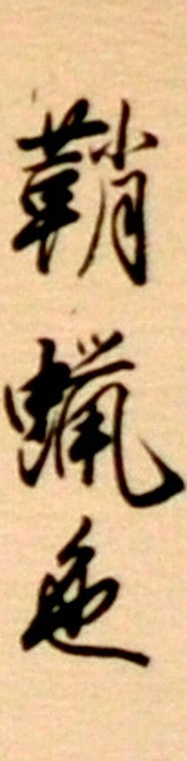鞘蠟色
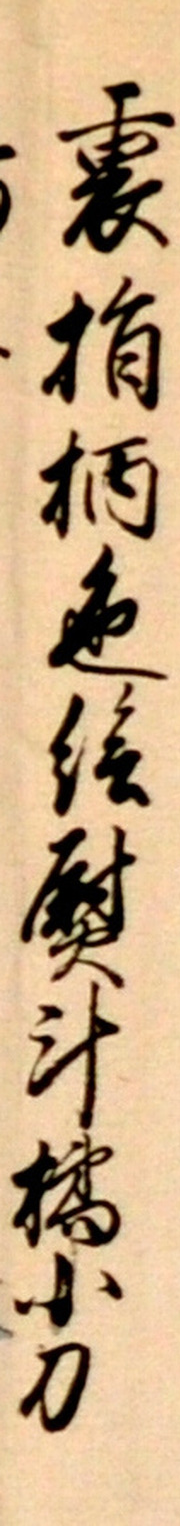裏指柄色絵熨斗橘小刀
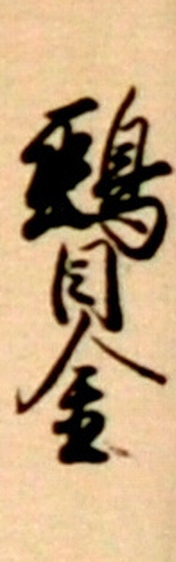鵐目金
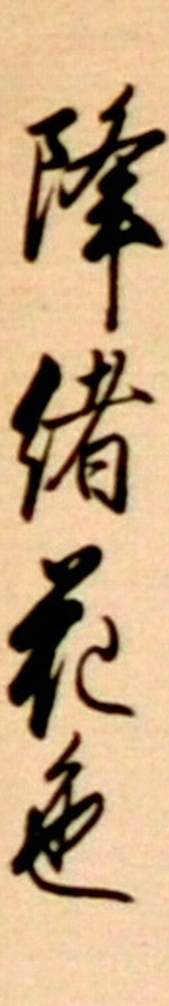降緒花色
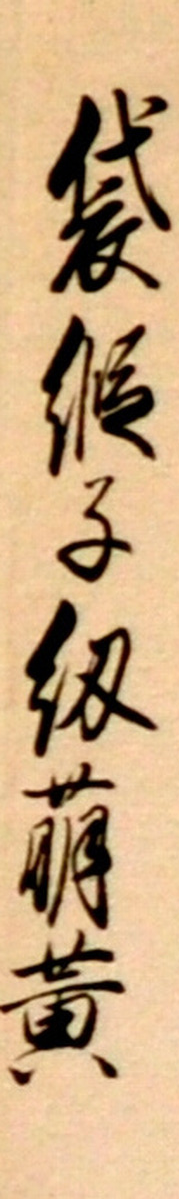袋緞子紉萌黄
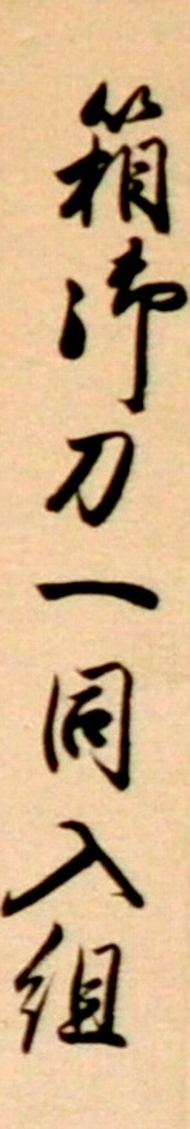箱御刀一同入組

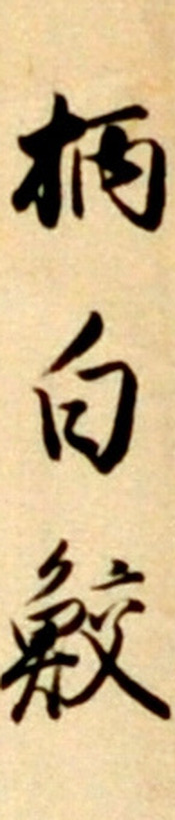柄白鮫
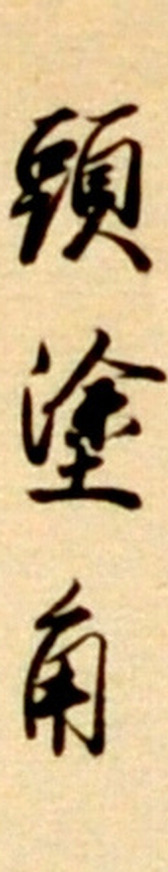頭塗角
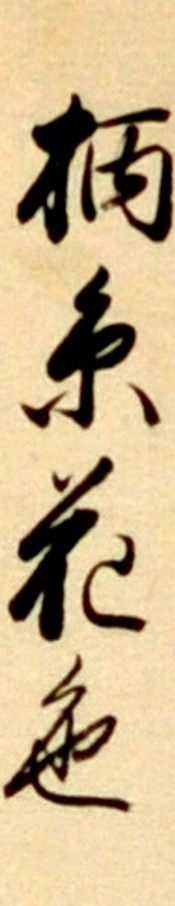柄糸花色
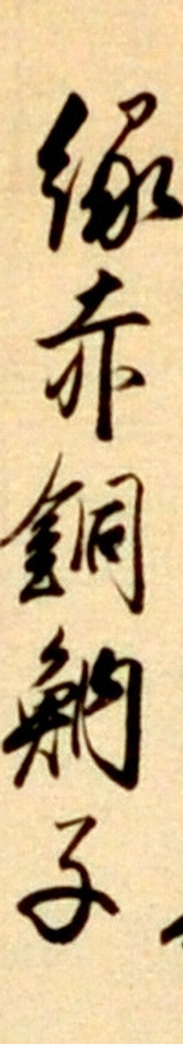縁赤銅魶子
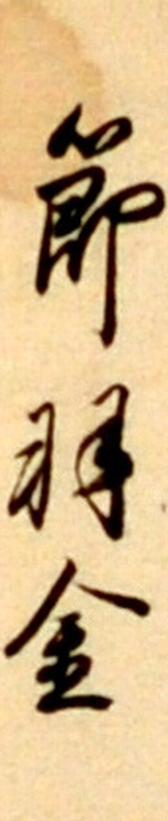節羽金
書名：御刀御拵之覚
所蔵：伊那市立高遠町図書館・合同会社AMANE
